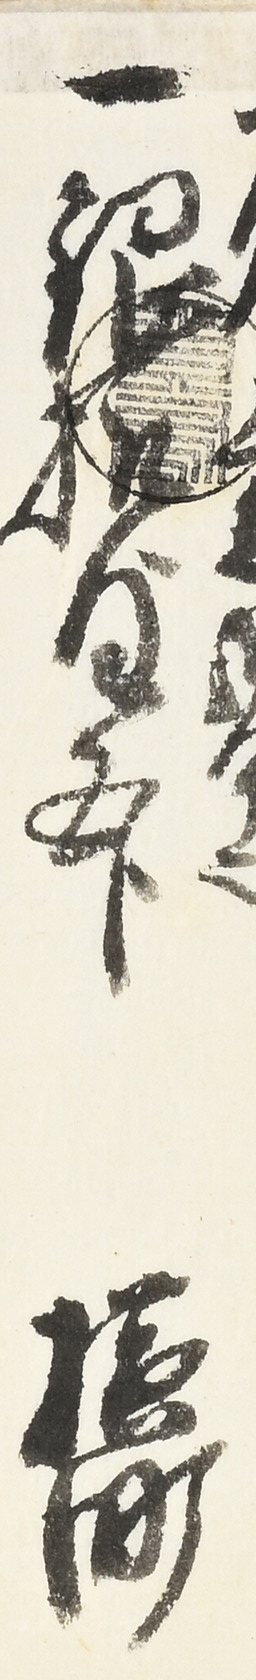一銀拾匁五横町
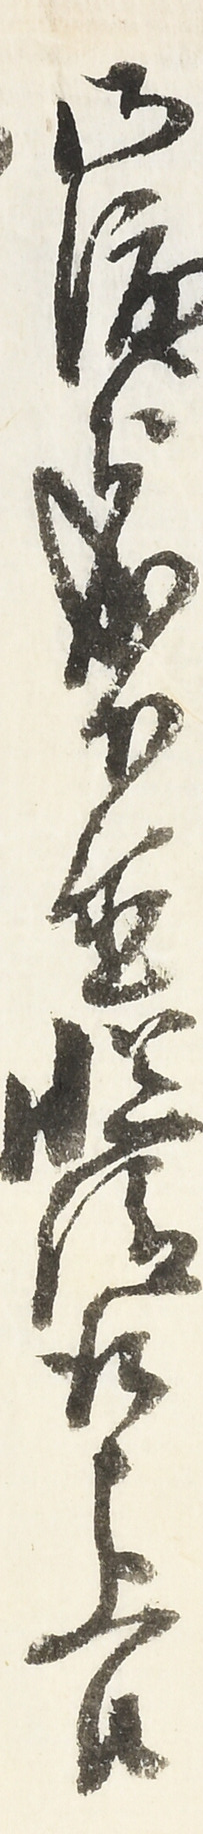御渡被成下置慥請取申上候
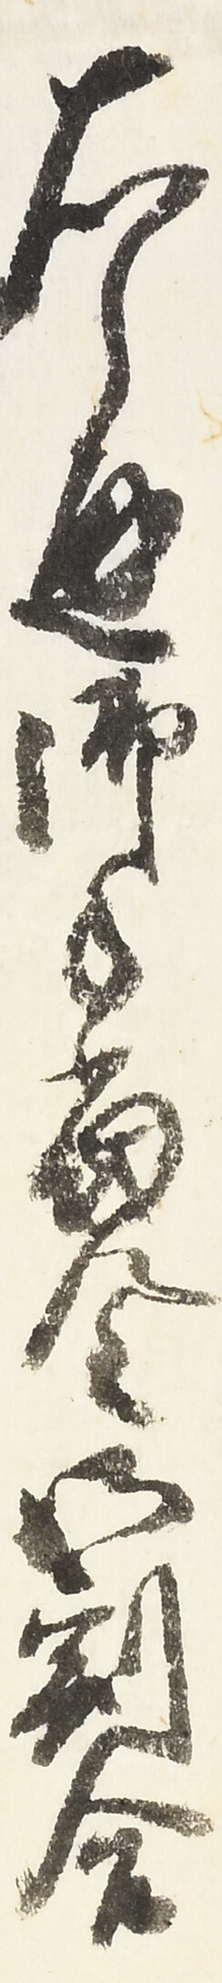右之通御手当金御割合
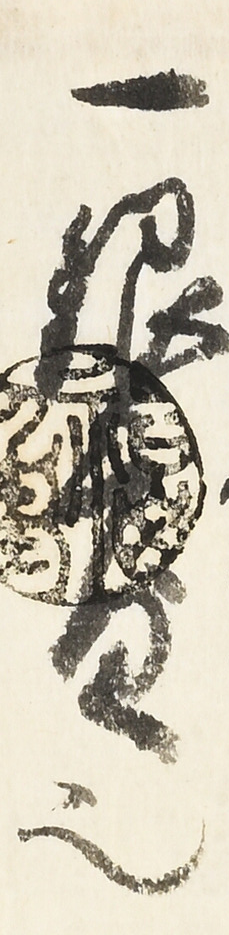一銀三匁也
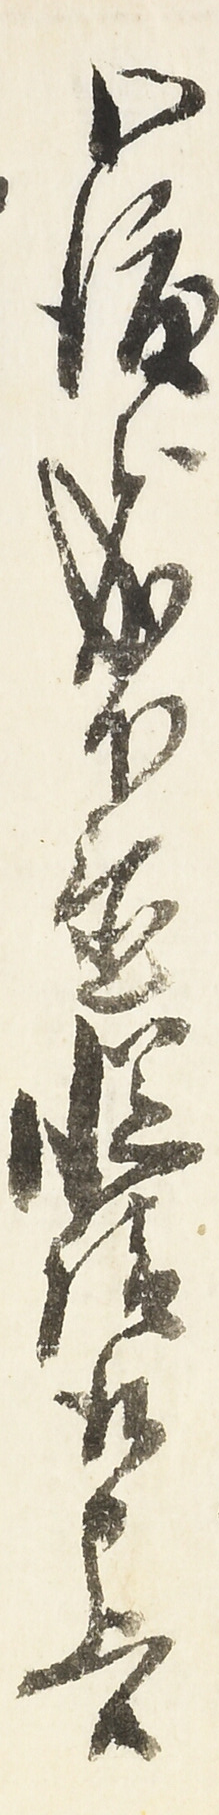御渡被成下置慥請取申上候
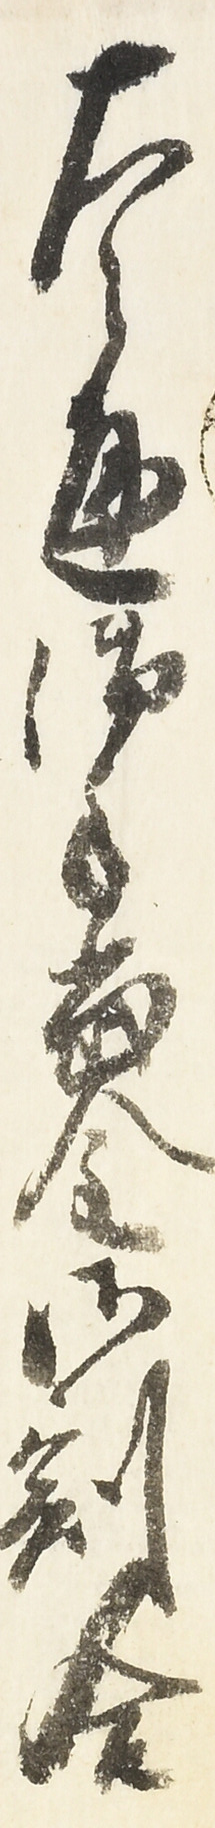右之通御手当金御割合
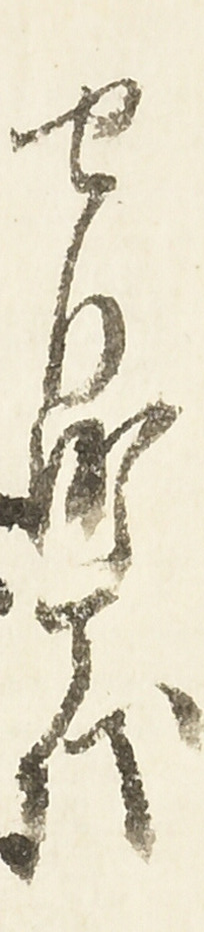せり町丁代
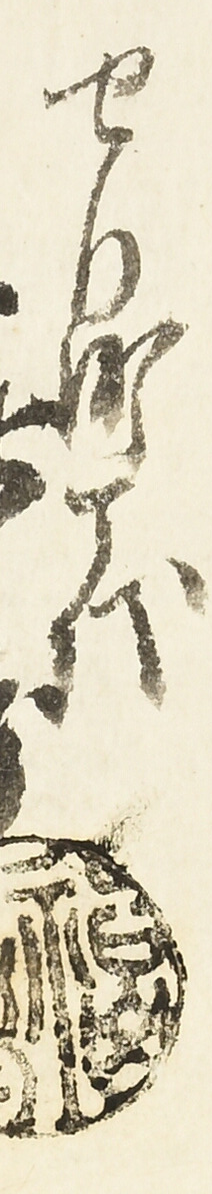せり町丁代
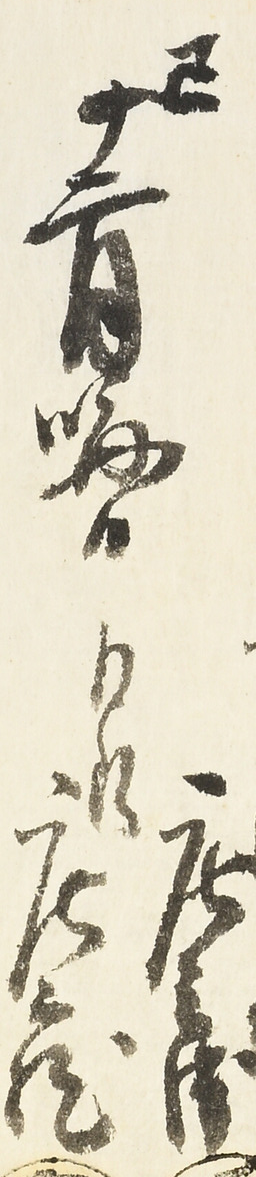十二月晦日同断
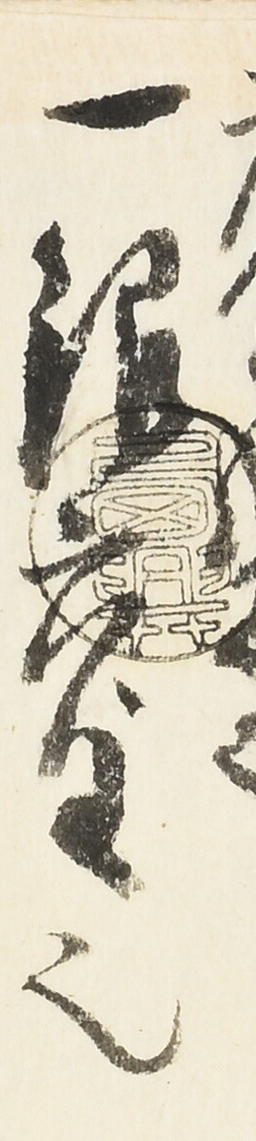一銀六匁也
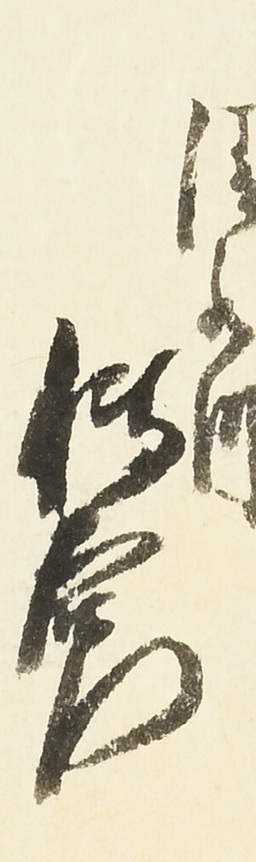伝右衛門
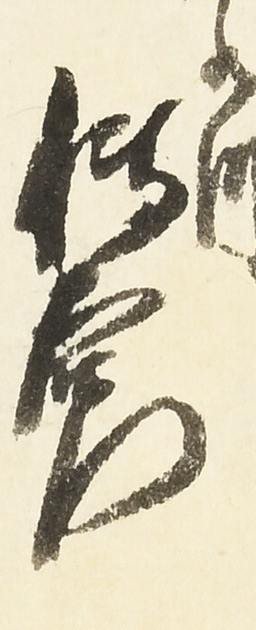伝右衛門
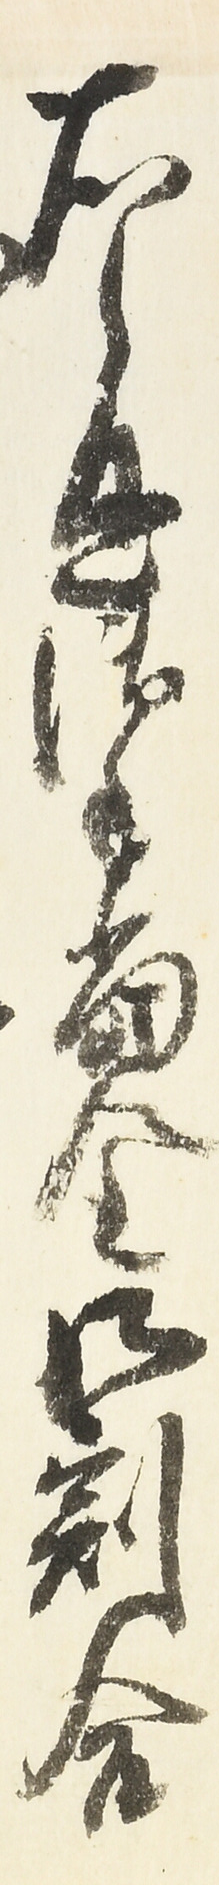右之通御手当金御割合
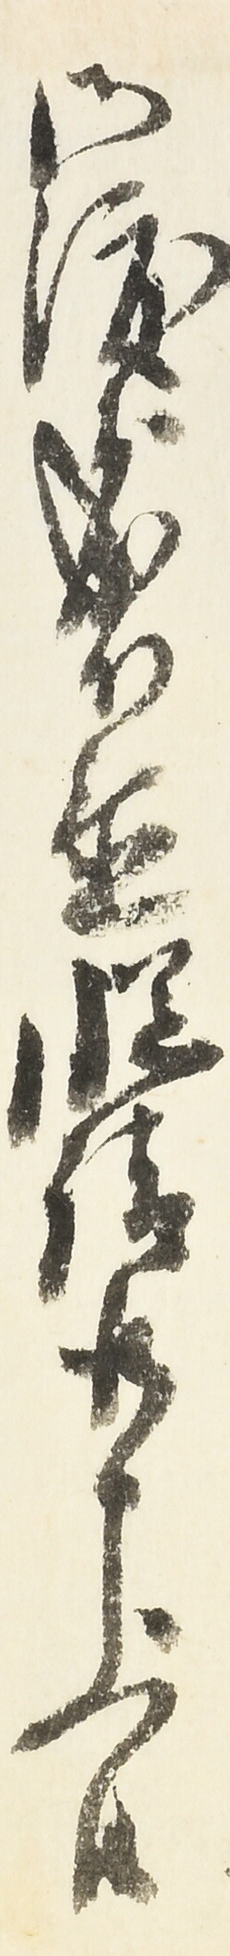御渡被成下置慥請取申上候
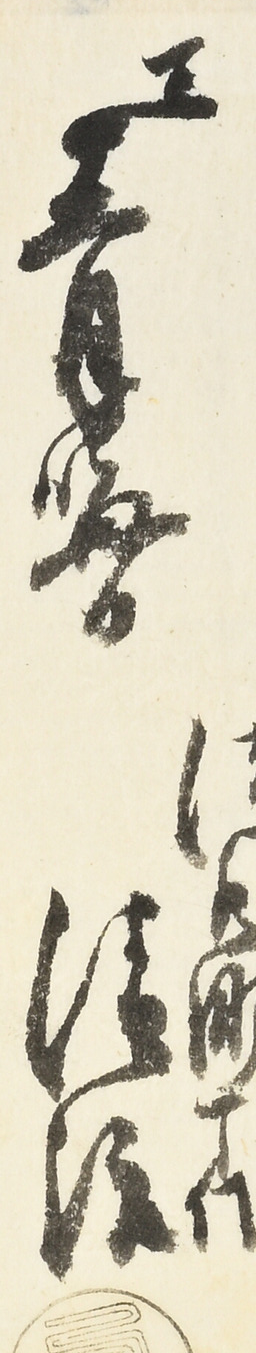十二月晦日清治

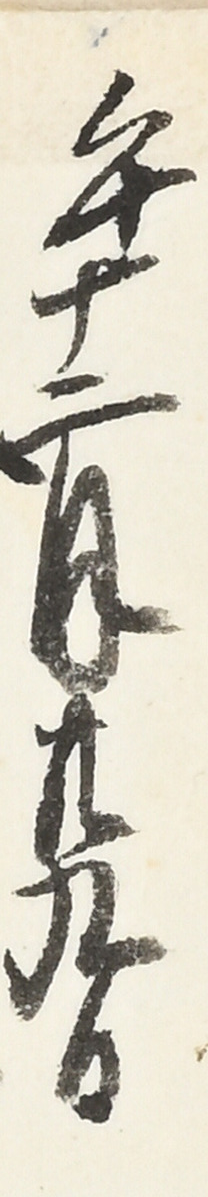午十二月廿九日
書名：御才覚金御利足割渡扣帳
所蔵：伊那市立高遠町図書館・合同会社AMANE
